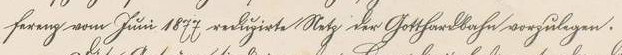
ferenz vom Juni 1877 reduzirte Netz der Gotthardbahn vorzulegen.
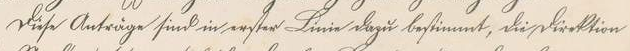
Diese Anträge sind in erster Linie bestimmt, die Direktion
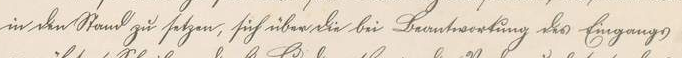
in den Stand zu setzen, sich über die bei Beantwortung des Eingangs
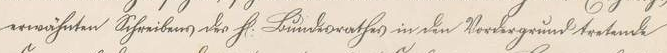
erwähnten Schreibens des h. Bundesrathes in den Vordergund tretende
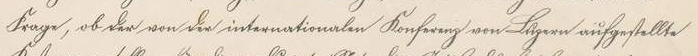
Frage, ob der von der internationalen Konferenz von Luzern aufgestellte
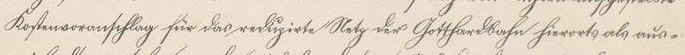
Kostenvoranschlag für das reduzirte Netz der Gotthardbahn hierorts als aus-
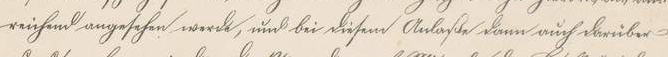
reichend angesehen werde, und bei diesem Anlaße dann auch darüber
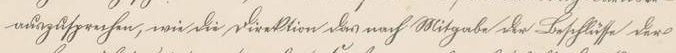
auszusprechen, wie die Direktion das nach Mitgabe der Beschlüsse der
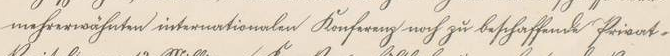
mehrerwähnten internationalen Konferenz nach zu beschaffende Privat-
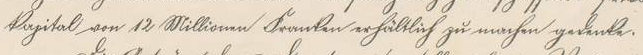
kapital von 12 Millionen Franken erhältlich zu machen gedenke.
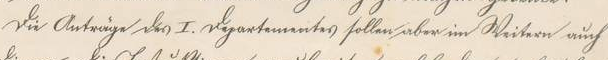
Die Anträge des I. Departementes sollen aber im Weitern auch
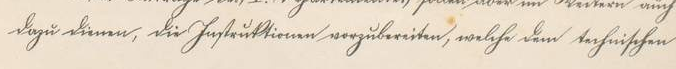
dazu dienen, die Instruktionen vorzubereiten, welche dem technischen
